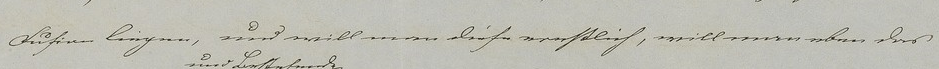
Fusion liegen, und will man diese ernstlich, will man eben das
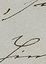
es
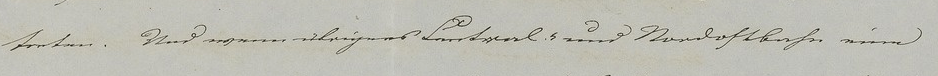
treten. Und wenn übrigens Central- und Nordostbahn eine
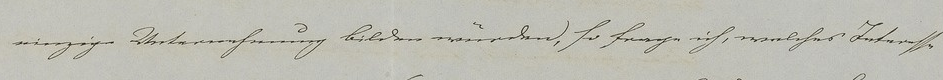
einzige Unternehmung bilden würden, so frage ich, welches Interesse
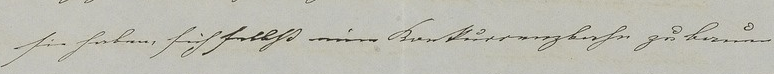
sie haben, sich selbst eine Konkurrenzbahn zu bauen. –
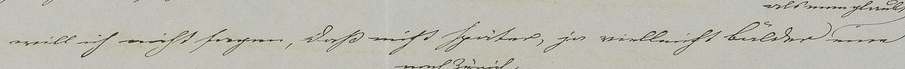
will ich nicht sagen, daß nicht später, ja vielleicht bälder als man
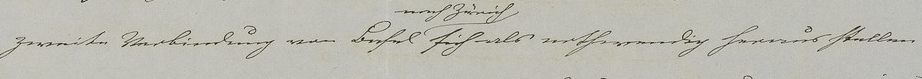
zweite Verbindung von Baselnach Zürich sich als nothwendig heraus stellen
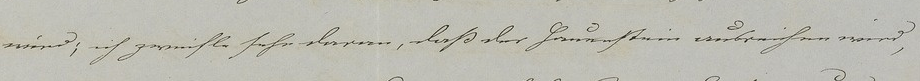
wird; ich zweifle sehr daran, daß der Hauenstein ausreichen wird,
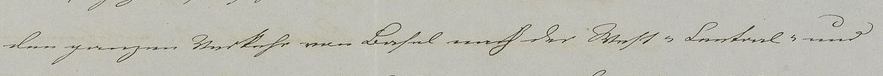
den ganzen Verkehr von Basel nach der West-Central- und
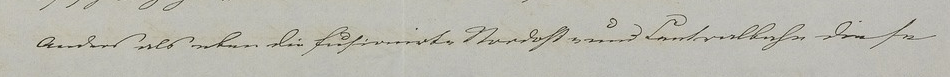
Anders als eben die fusionirte Nordost- und Centralbahn diese
